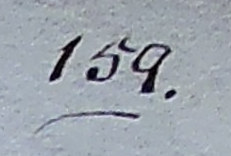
159.
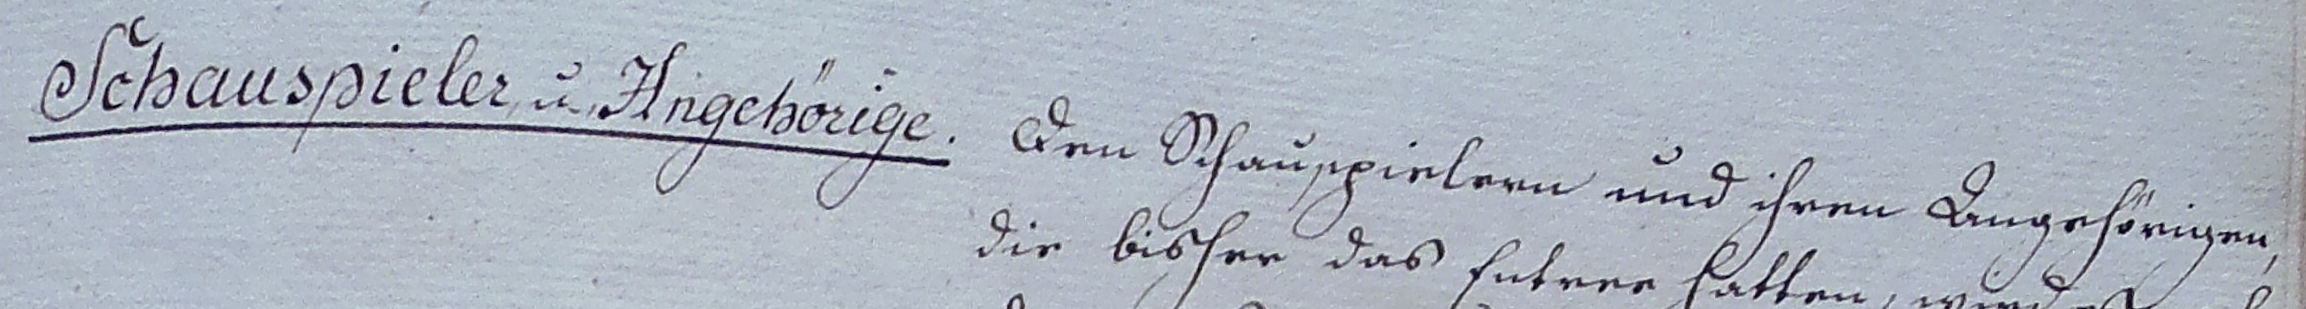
Schauspieler, u., Angehörige. Den Schauspielern und ihren Angehörigen,
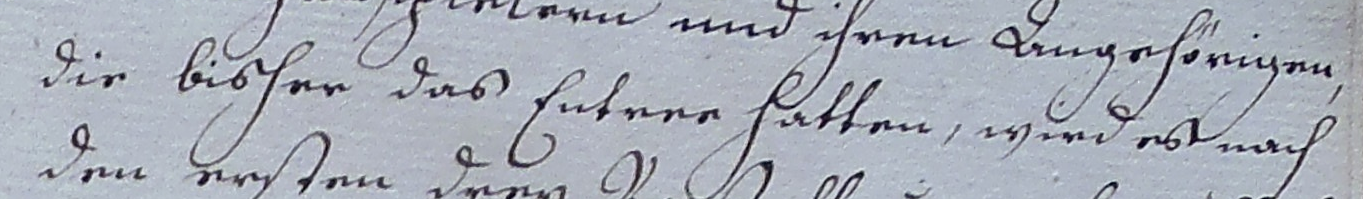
die bisher das Entree hatten, wird es nach
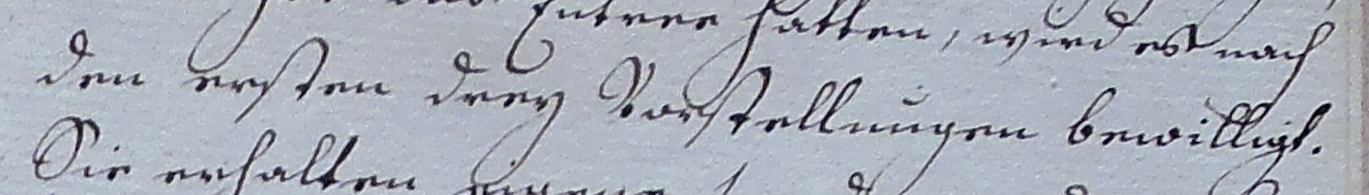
den ersten drey Vorstellungen bewilligt.
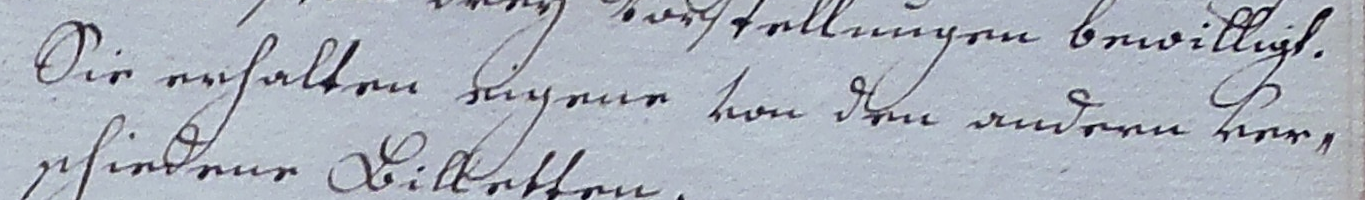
Sie erhalten eigene von den andern ver¬
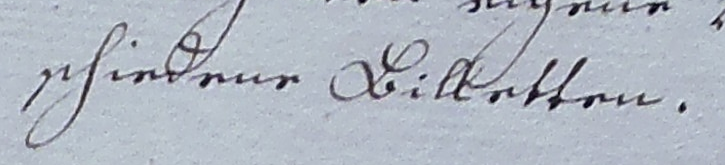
schiedene Billetten.
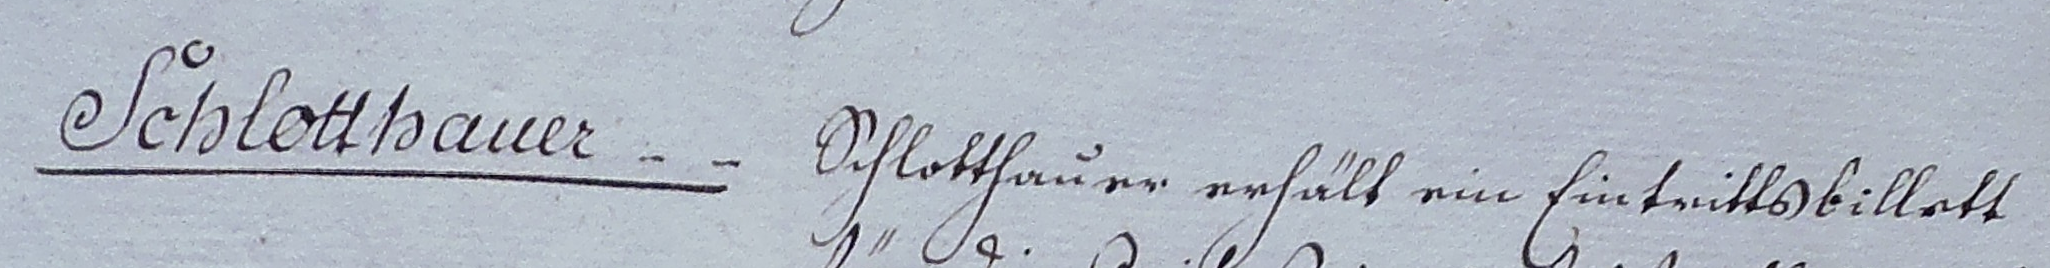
Schlotthauer .. .. Schlotthauer erhält ein Eintrittsbillett
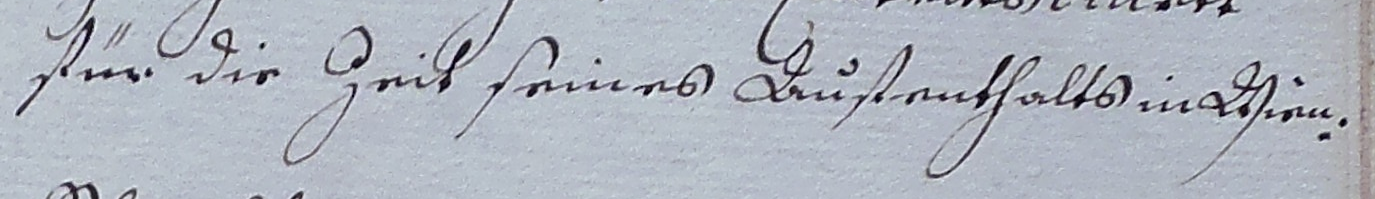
für die Zeit seines Aufenthalts in Wien.
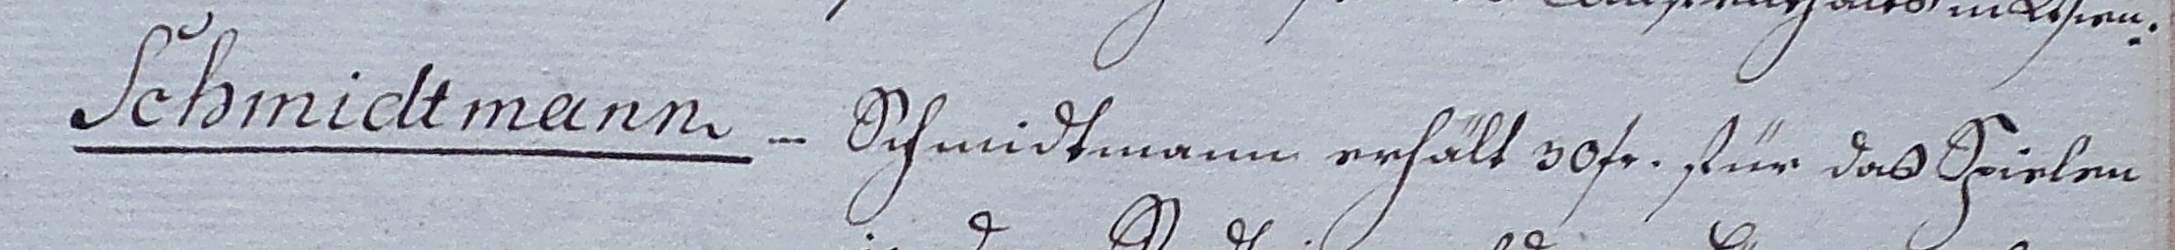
Schmidtmann ... Schmidtmann erhält 30fr. für das Spielen
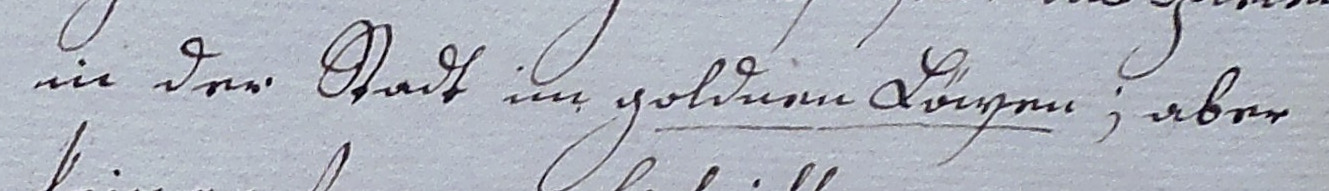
in der Stadt im goldenen Löwen; aber
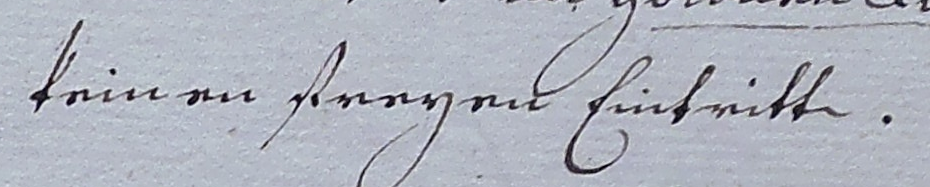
keinen freyen Eintritt.
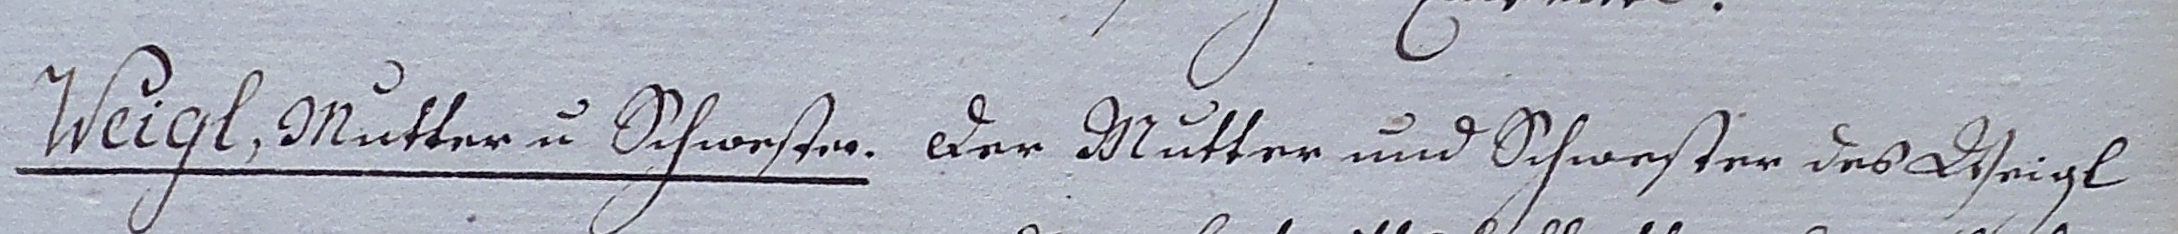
Weigl, Mutter u Schwester. Der Mutter und Schwester des Weigl
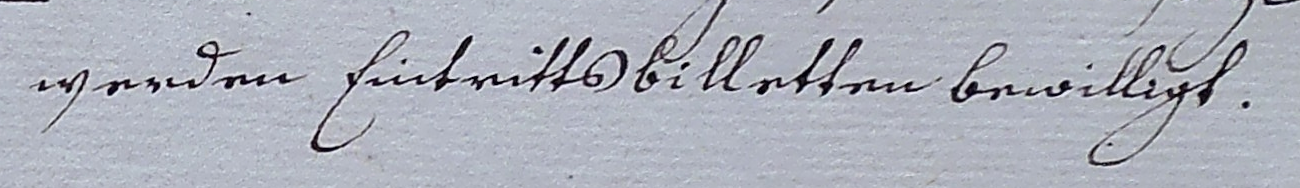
werden Eintrittsbilletten bewilligt.
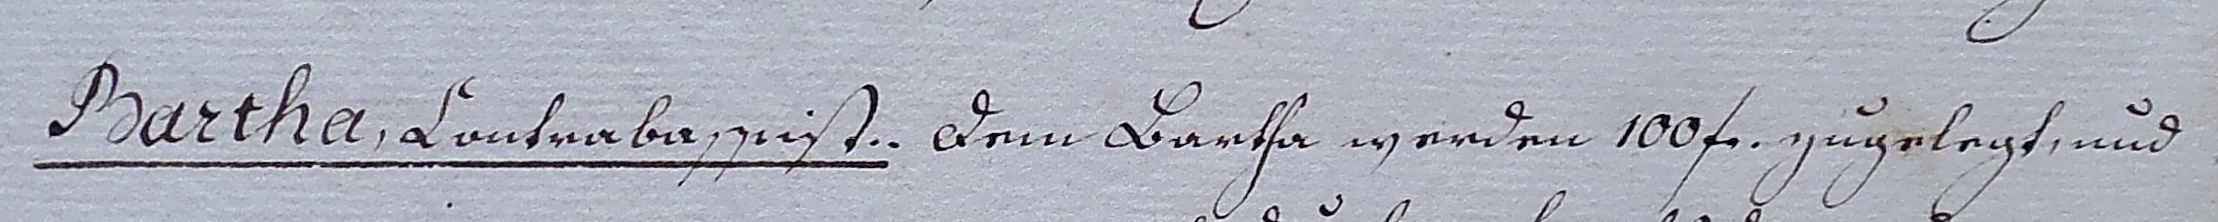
Bartha, Contrabassist.. Dem Bartha werden 100fr. zugelegt, und
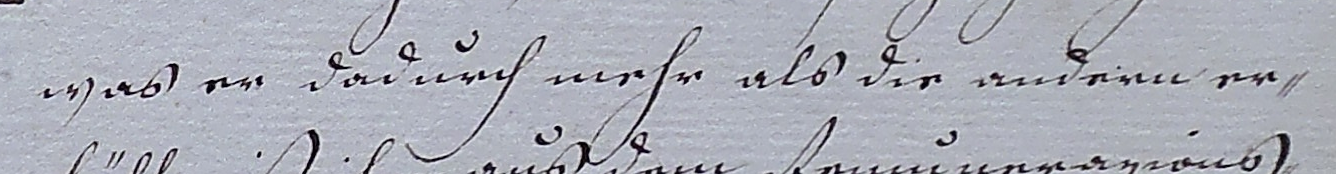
was er dadurch mehr als die andern er¬
